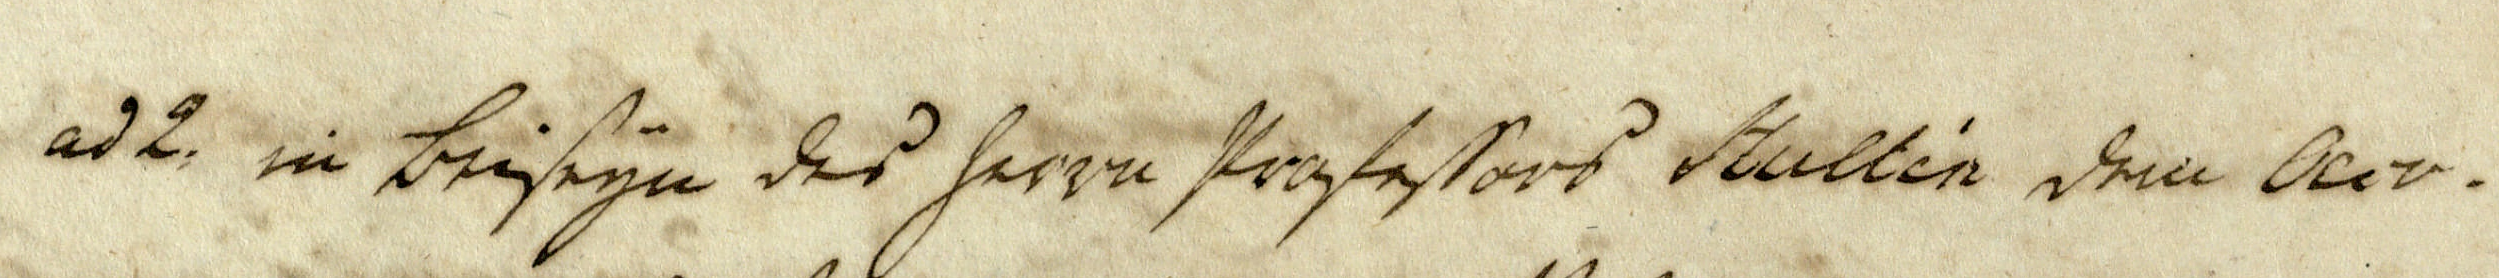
ad 2. im Beisein des Herrn Professors Hultén dem Oeco¬
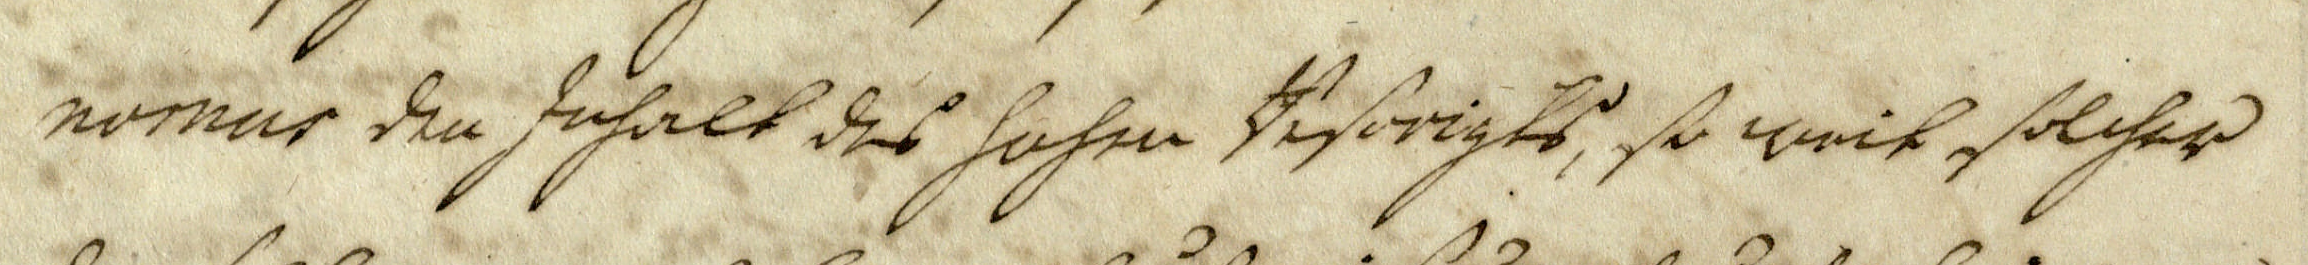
nomus den Inhalt des hohen Rescripts, so weit solcher
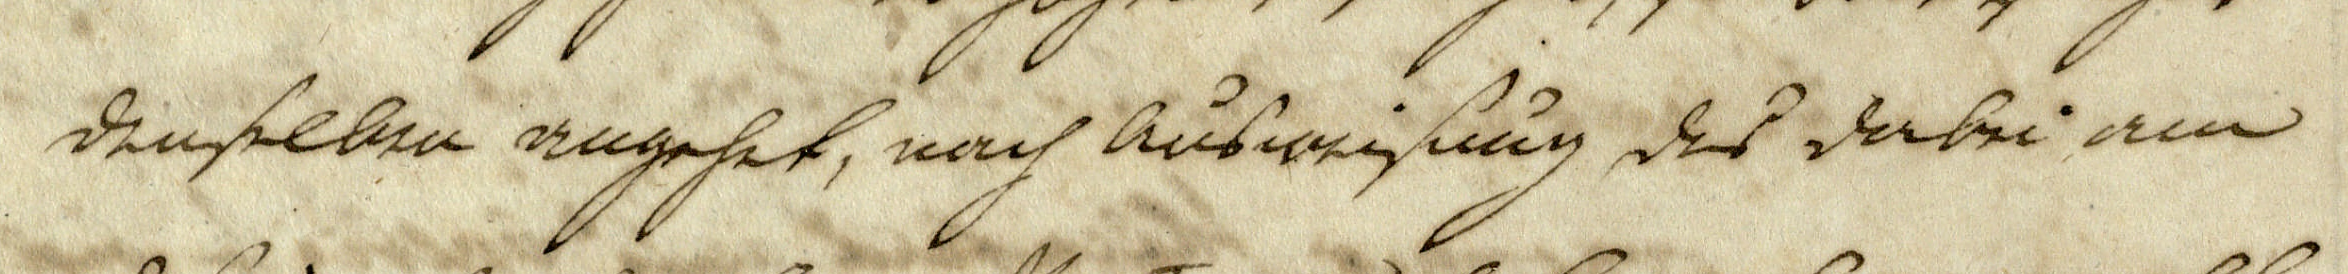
denselben angehet, nach Ausweisung des dabei am
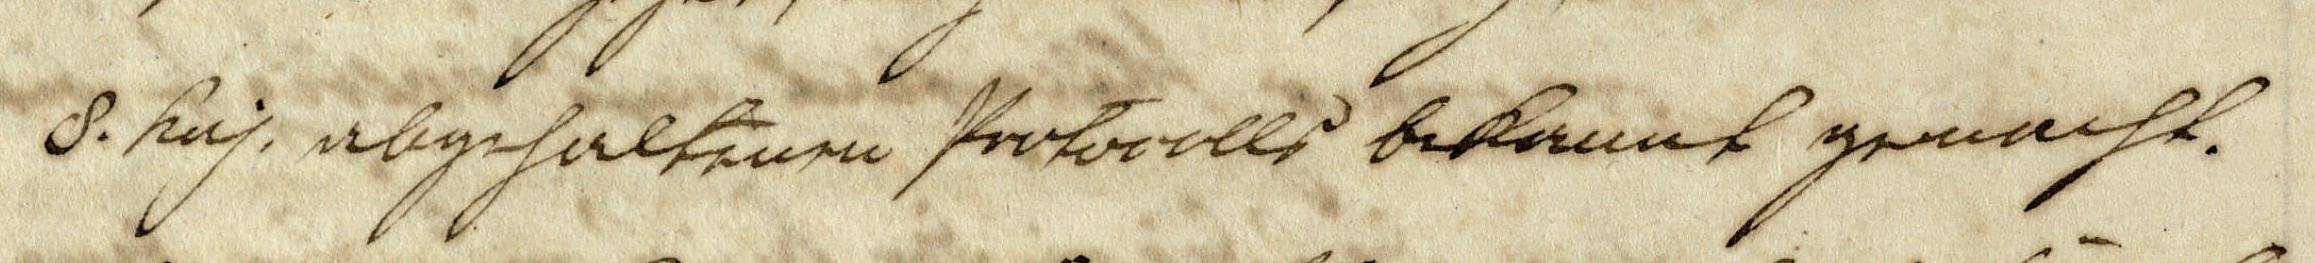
8. huj. abgehaltenen Protocolls bekannt gemacht.
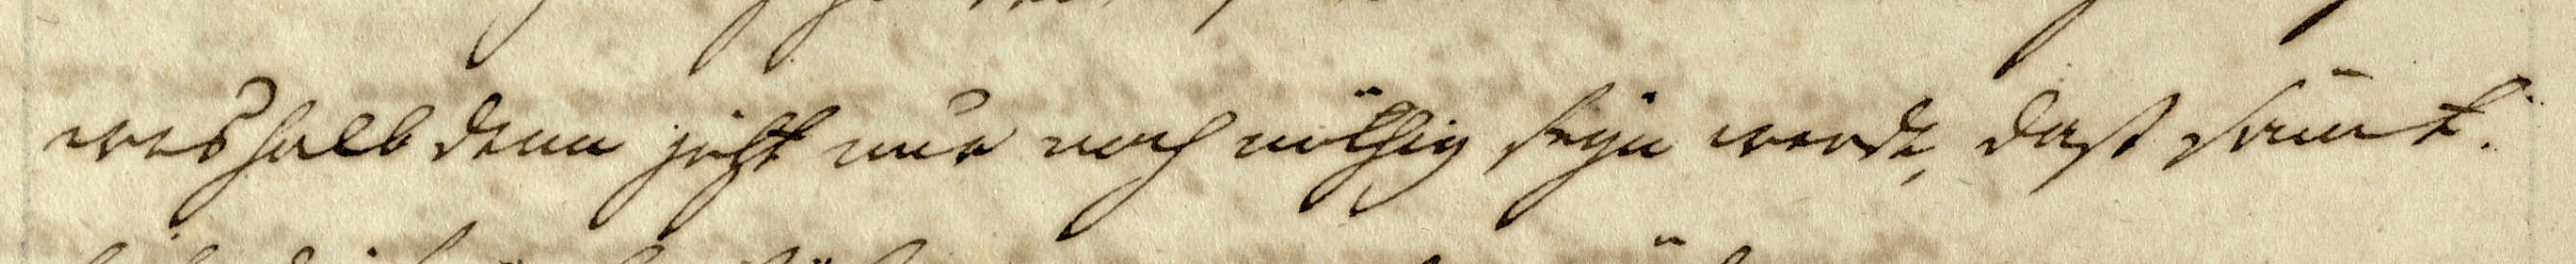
weshalb denn jetzt nur noch nöthig seÿn werde, daß sämt¬
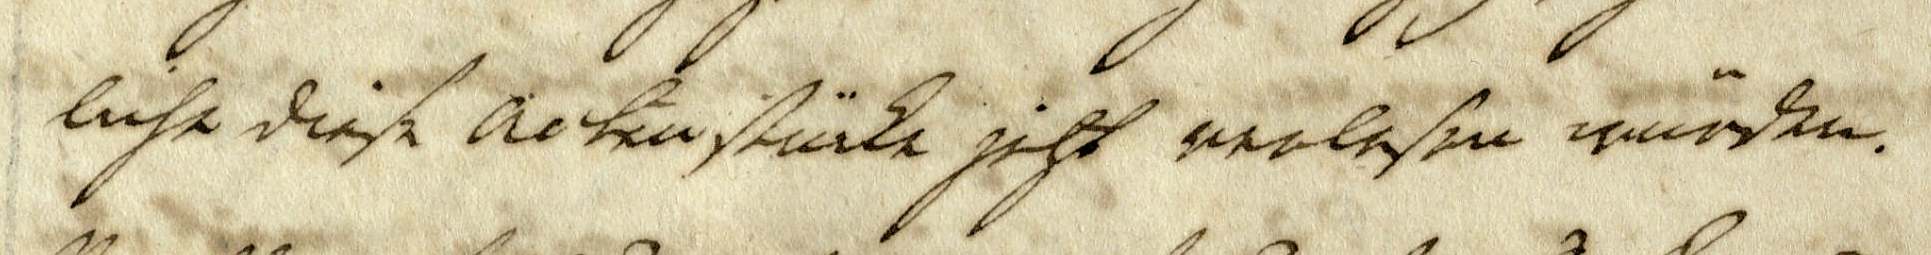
liche diese Actenstücke jetzt verlesen würden.
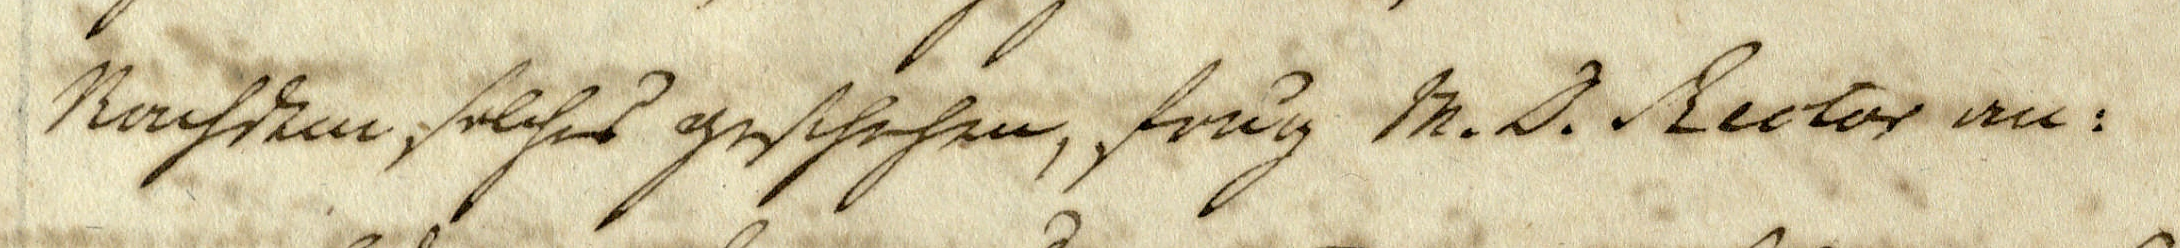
Nachdem solches geschehen, frug M. D. Rector an,
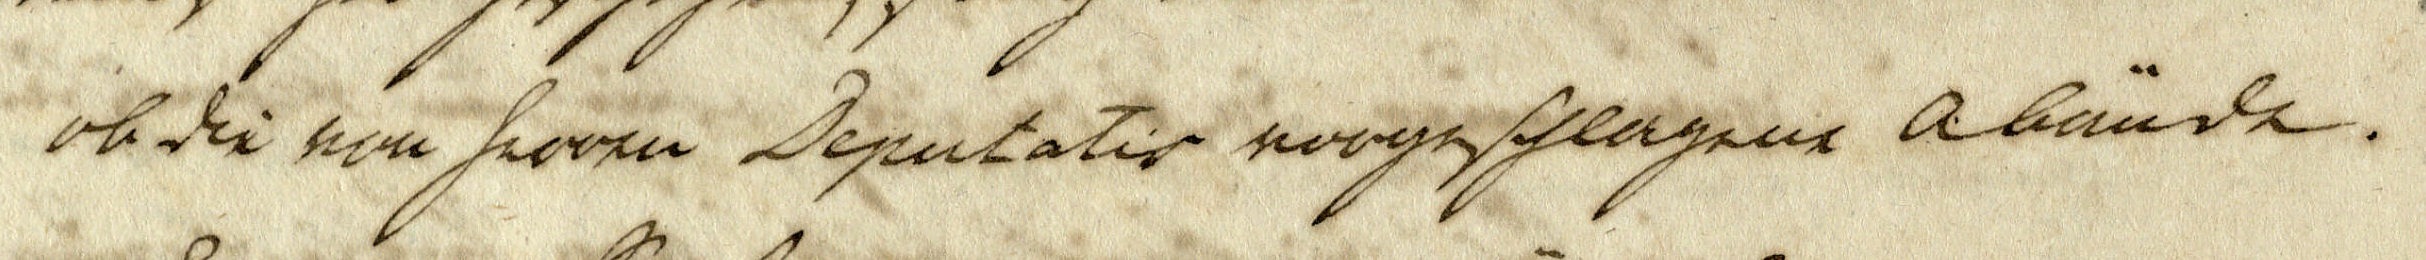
ob die von Herren Deputatis vorgeschlagene Abände¬
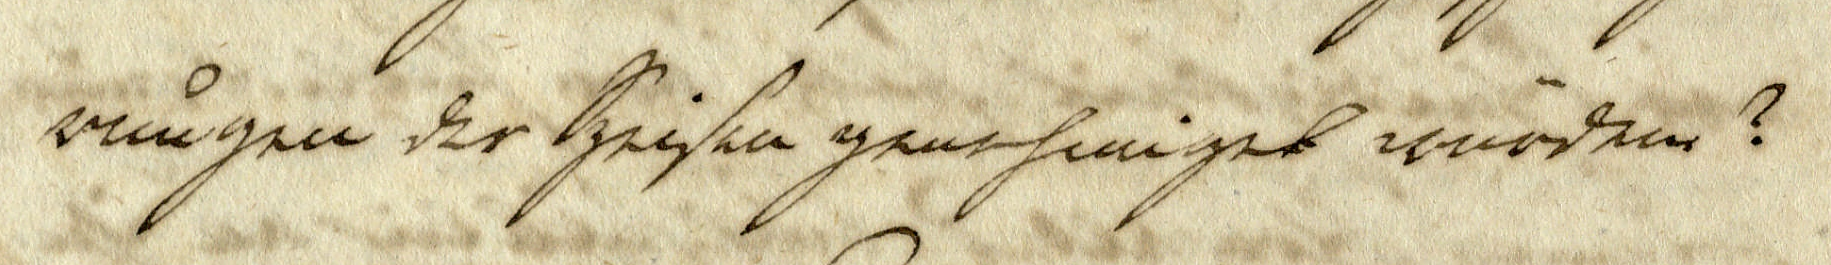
rungen der Speisen genehmiget würden?
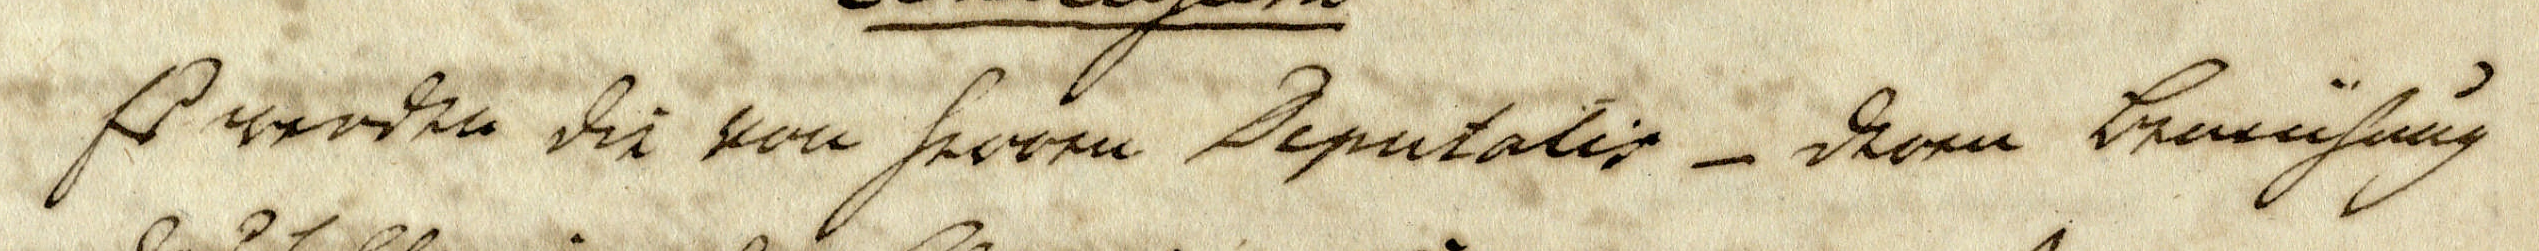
Es werden die von Herren Deputatis deren Bemühung
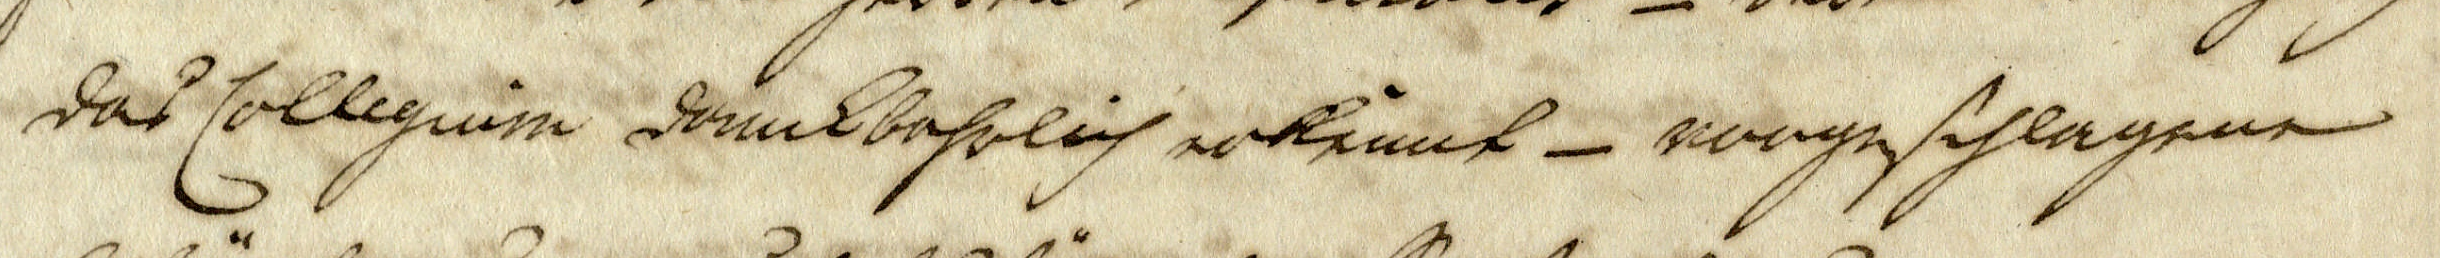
das Collegium danckbahrlich erkennt vorgeschlagene
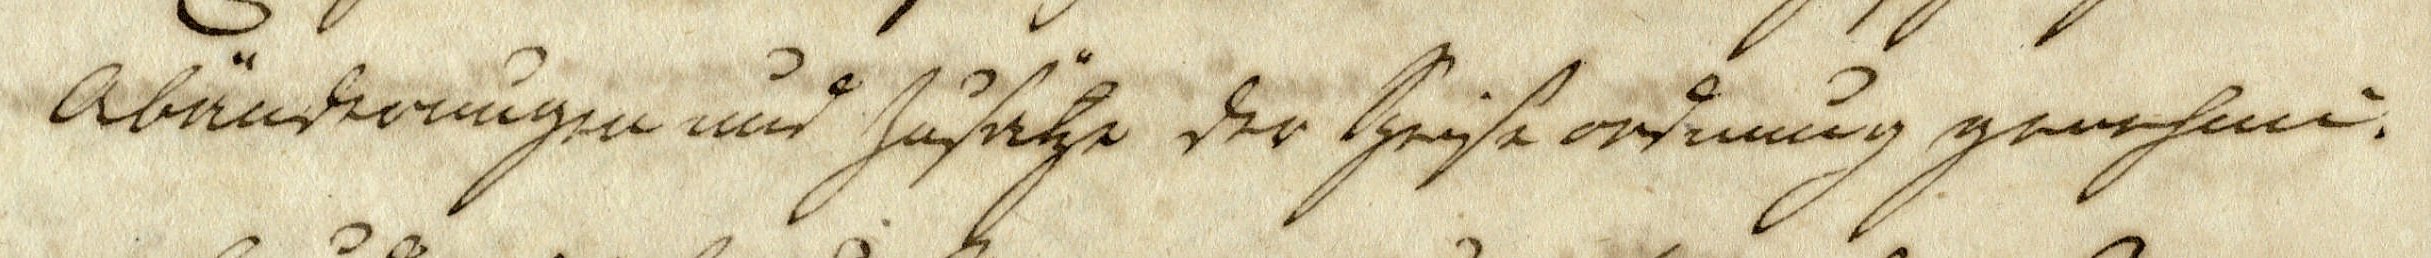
Abänderungen und Zusätze der Speiseordnung genehmi¬
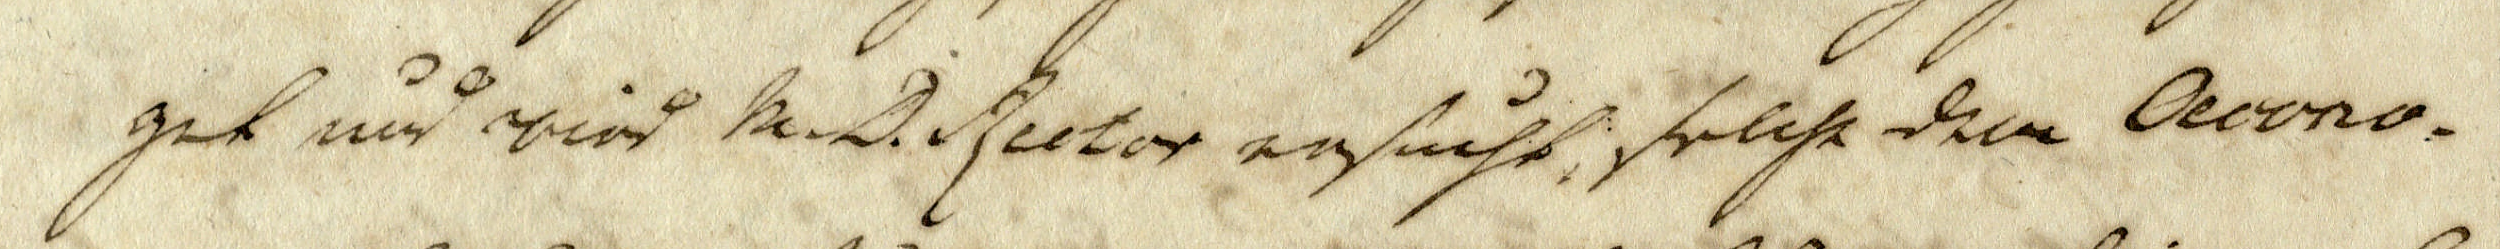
get und wird M. D. Rector ersucht, solche dem Oecono¬
